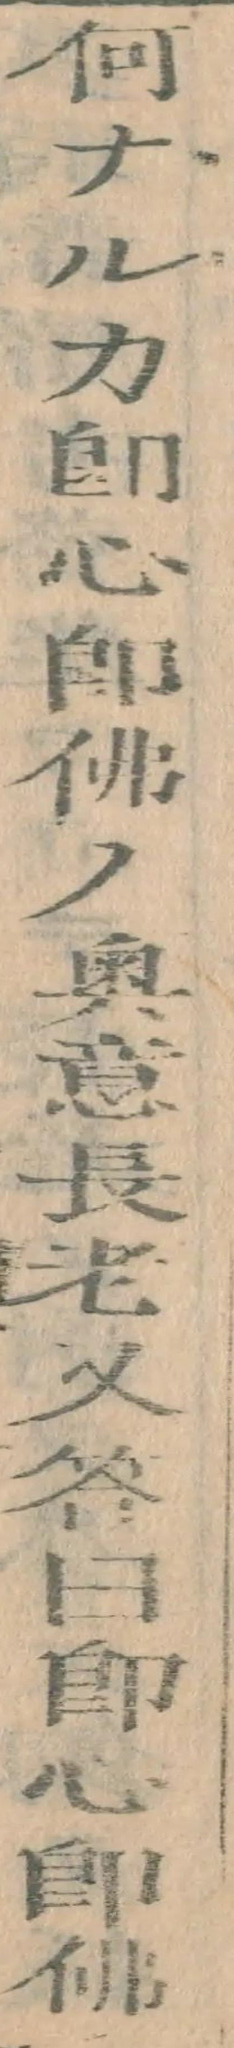何ナルカ即心即仏ノ奥意長老又答曰即心即仏

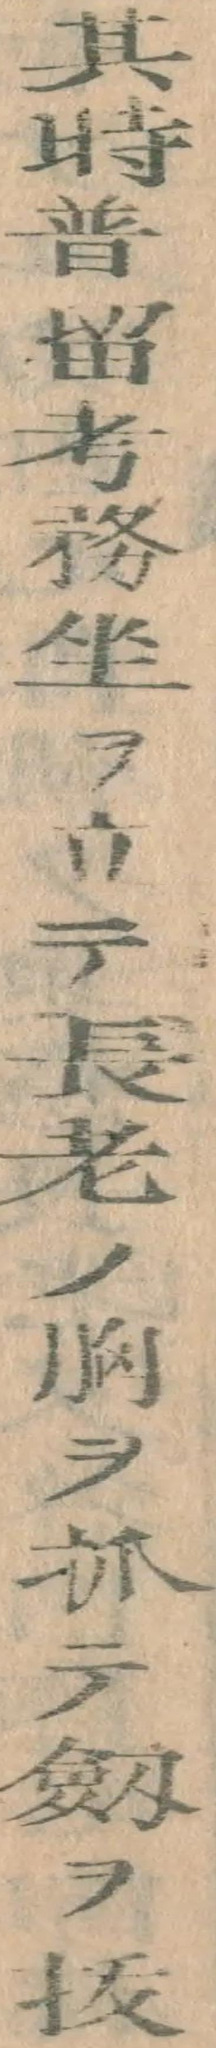其時普留考務坐ヲ立テ長老ノ胸ヲ抓テ剣ヲ抜
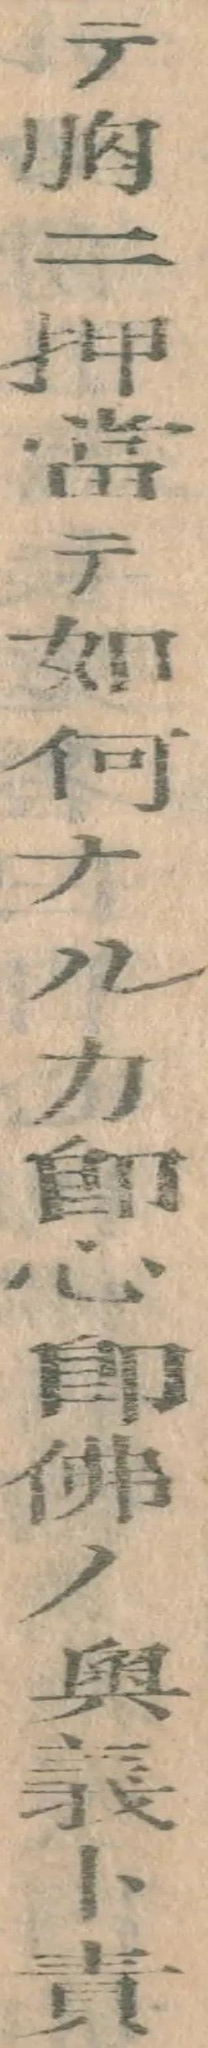テ胸ニ押当テ如何ナルカ即心即仏ノ奥義ト責
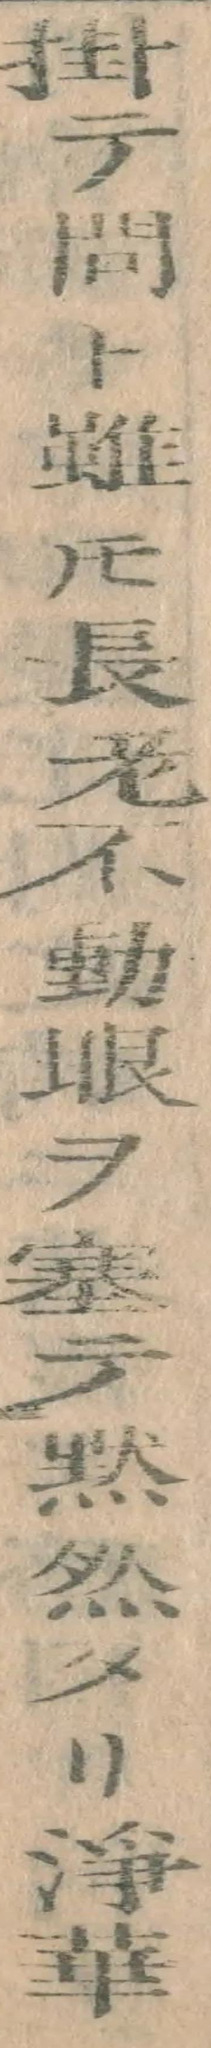掛テ問ト雖トモ長老不動眼ヲ塞テ黙然タリ浄華
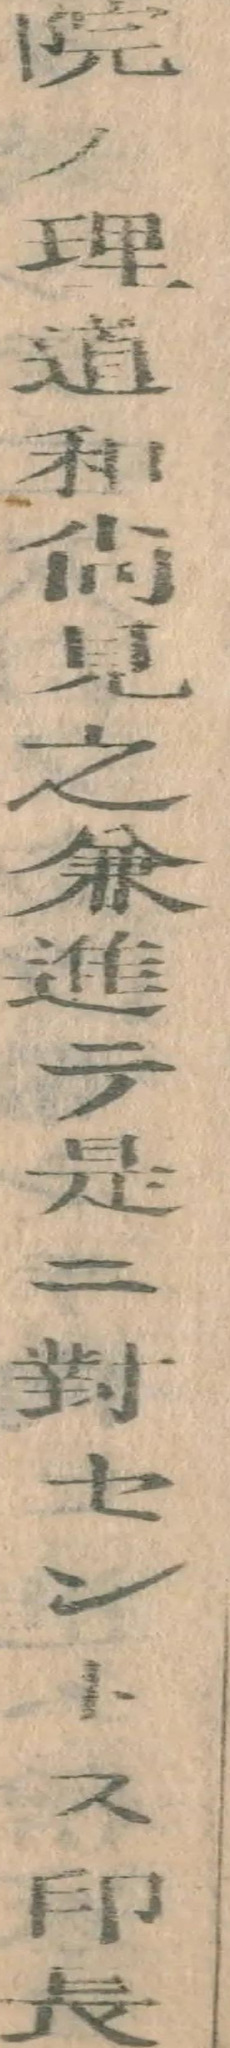院ノ理道和尚見之兼進テ是ニ対セントス印長
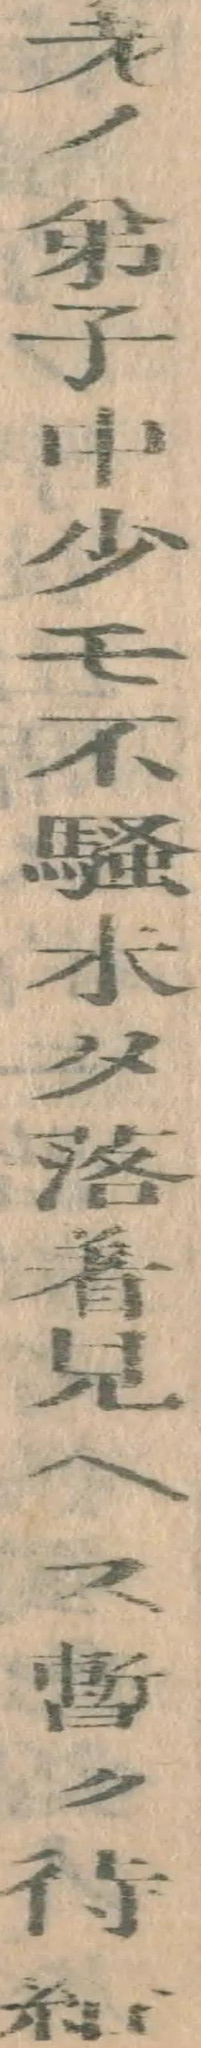老ノ弟子中少モ不騒未タ落着見ヘス暫ク待給
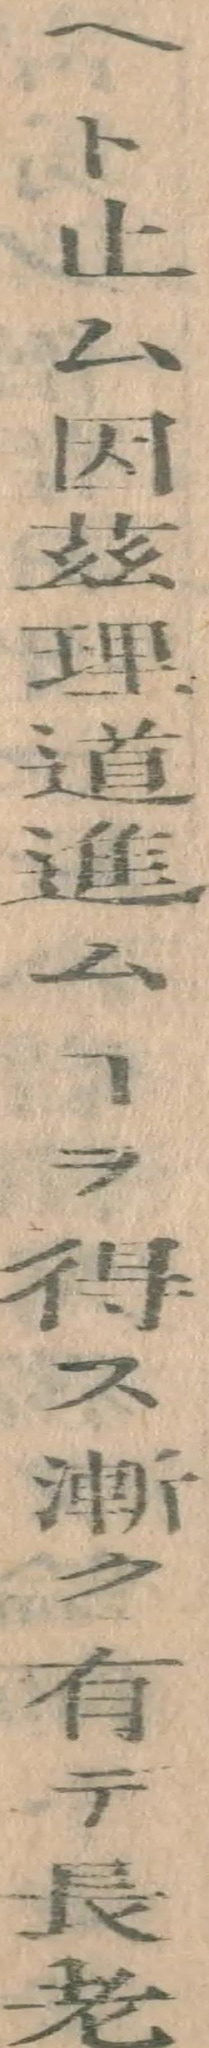ヘト止ム因茲理道進ムヿヲ得ス漸ク有テ長老
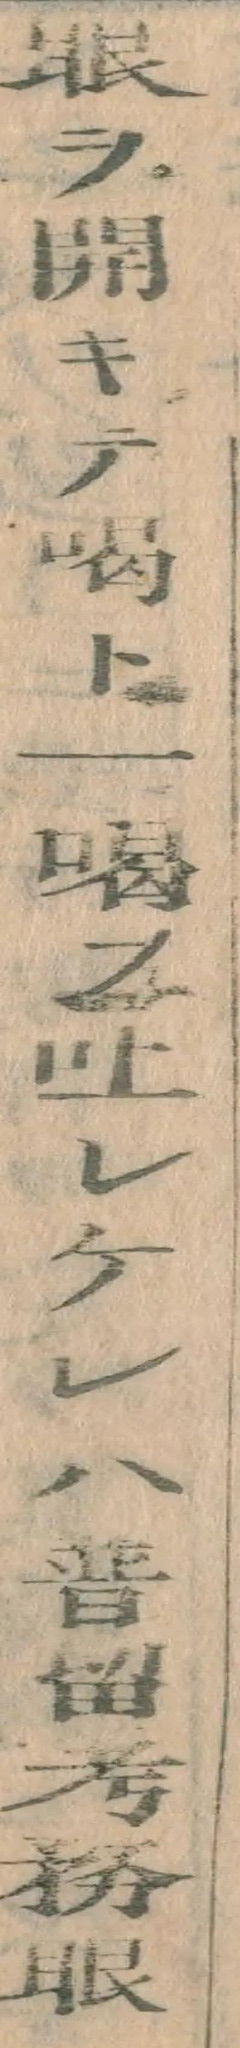眼ヲ開キテ喝ト一喝ヲ吐レケレハ普留考務眼
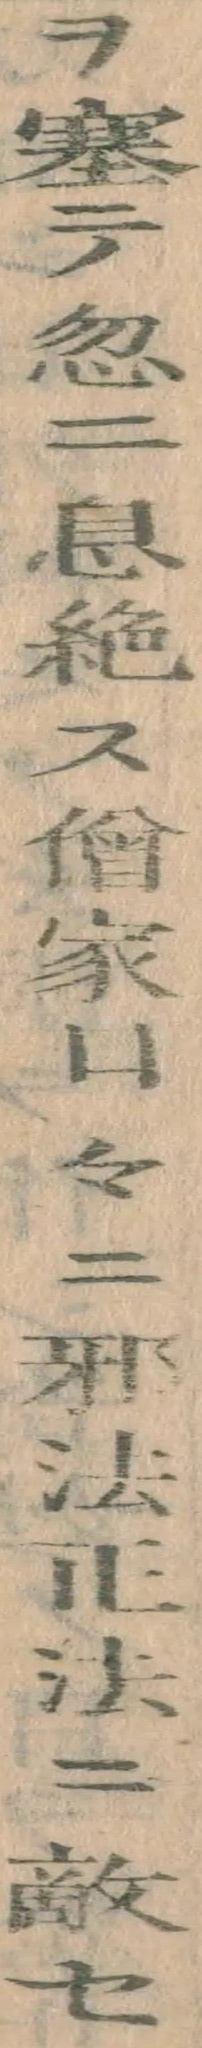ヲ塞テ忽ニ息絶ス僧家口々ニ邪法正法ニ敵セ
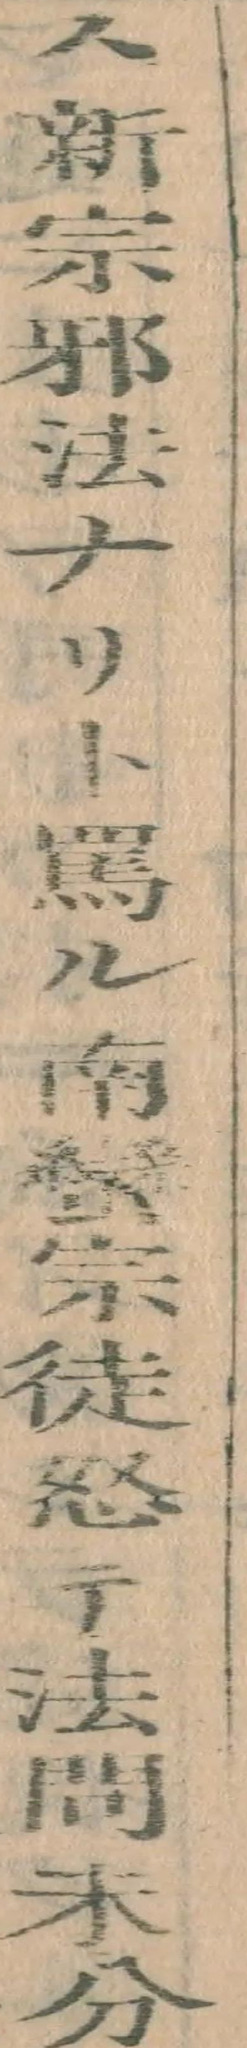ス新宗邪法ナリト罵ル南蛮宗徒怒テ法問未分
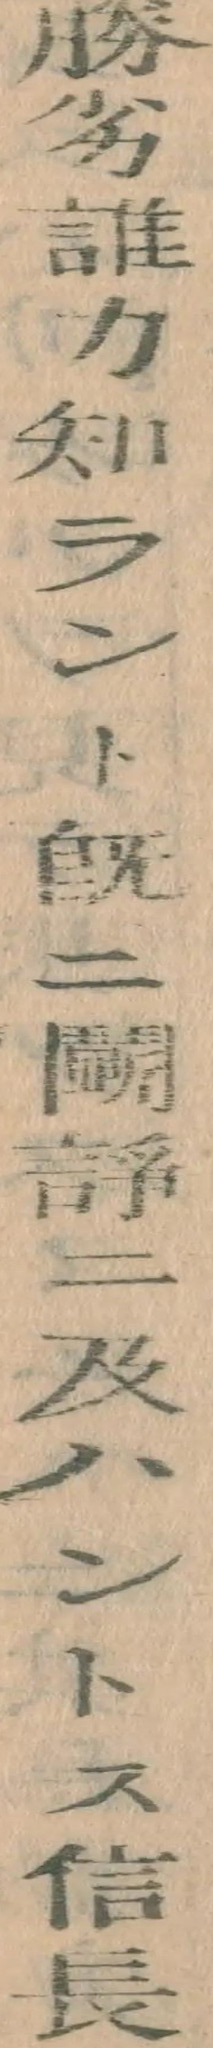勝劣誰カ知ラント既ニ闘諍ニ及ハントス信長
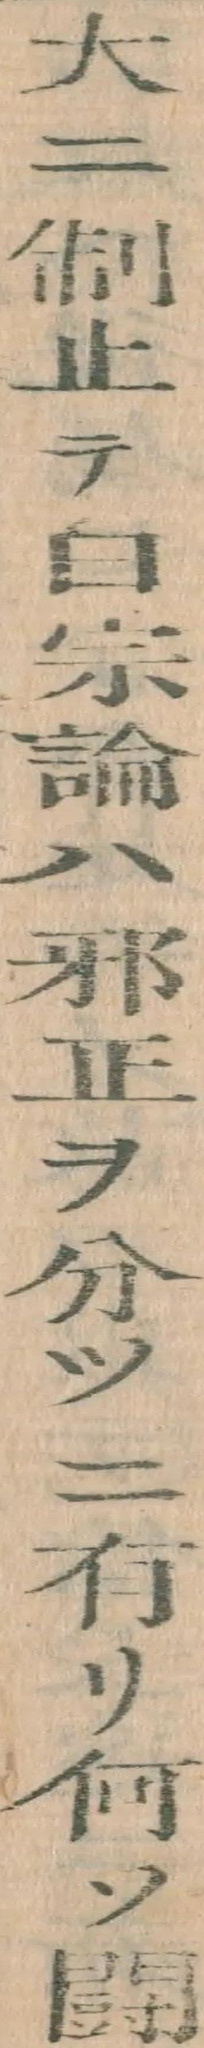大ニ制止テ曰宗論ハ邪正ヲ分ツニ有リ何ソ闘
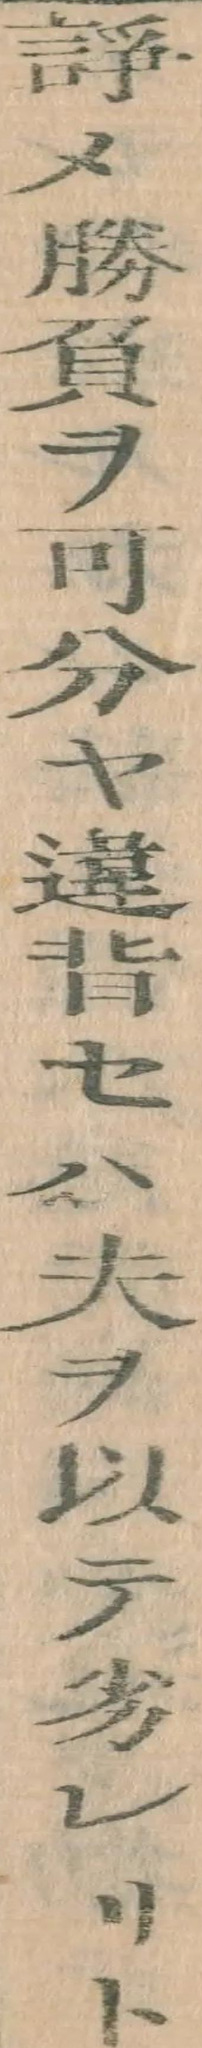諍シテ勝負ヲ可分ヤ違背セハ夫ヲ以テ劣レリト
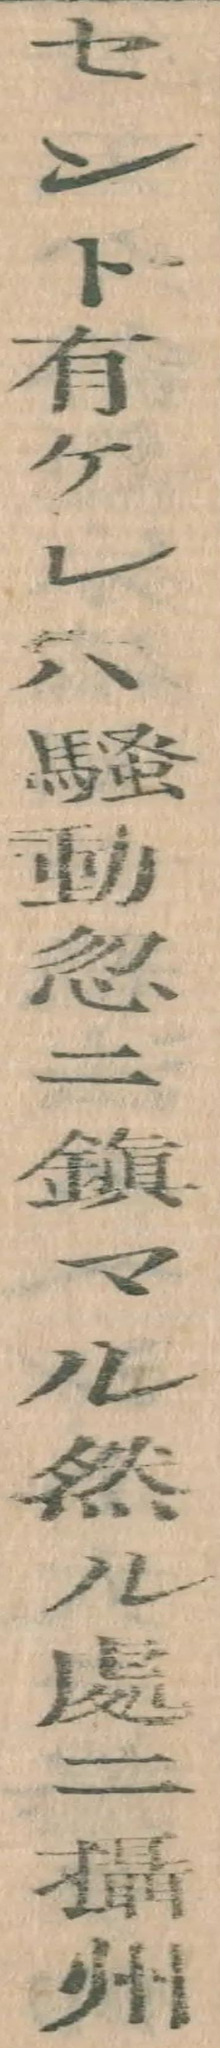セント有ケレハ騒動忽ニ鎮マル然ル処ニ摂州
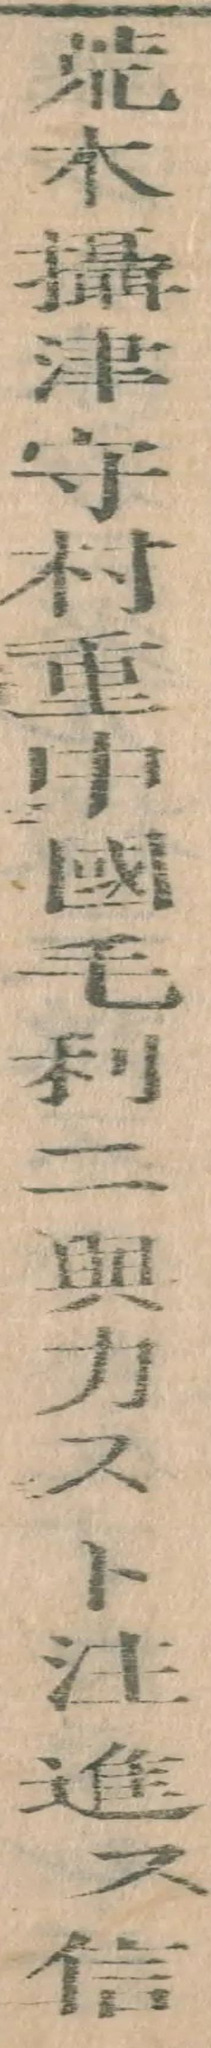荒木摂津守村重中国毛利ニ与力スト注進ス信
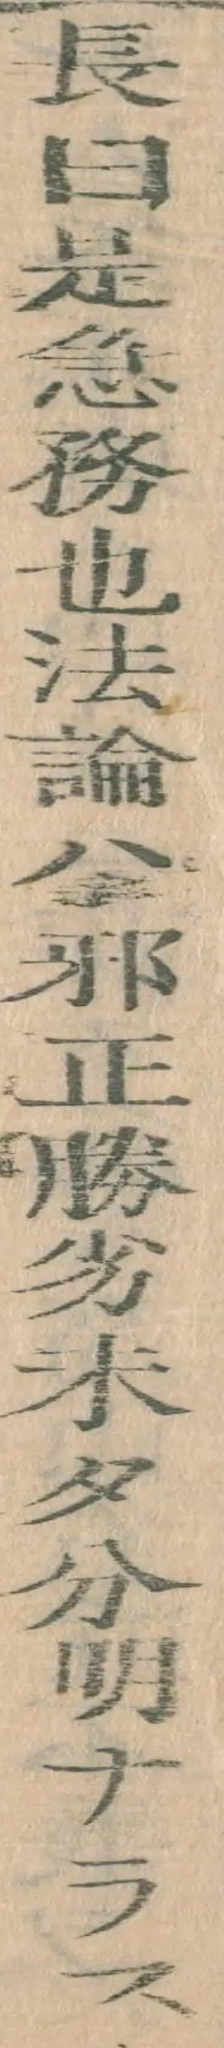長曰是急務也法論ハ邪正勝劣未タ分明ナラス
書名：南蛮寺興廃記
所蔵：国立国会図書館 National Diet Library, JAPAN
